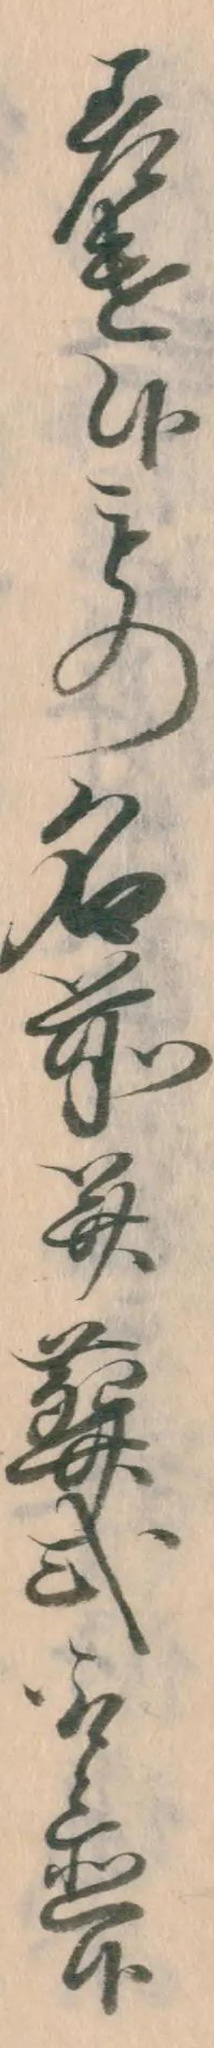差遣候もの名前并葬式取置候
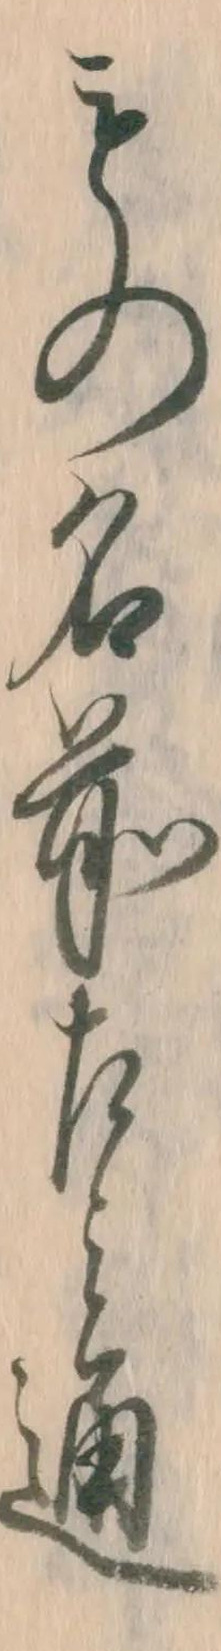もの名前左之通
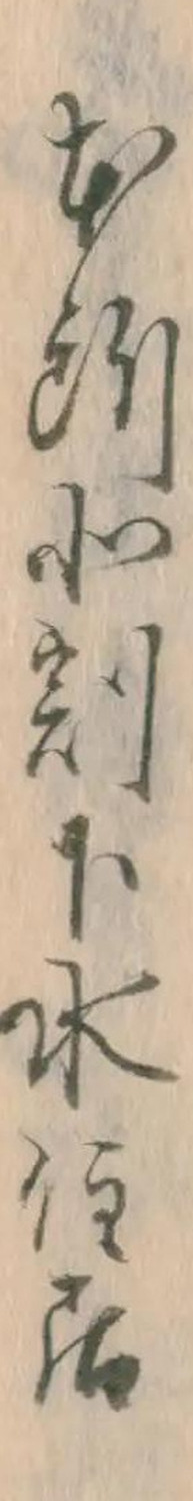本所北割下水住居
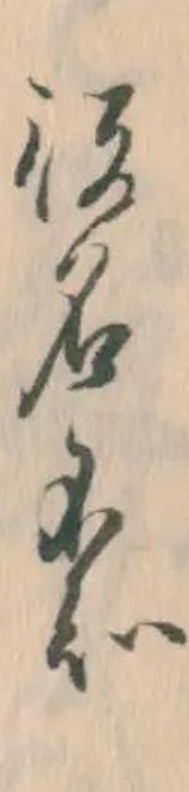役名不知
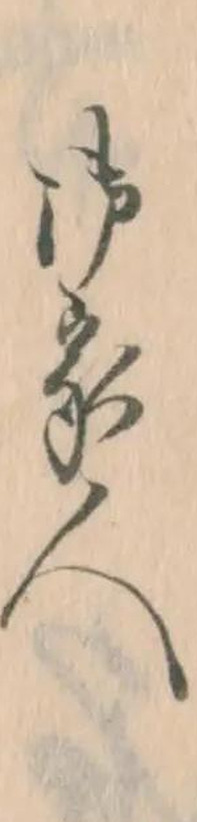御家人
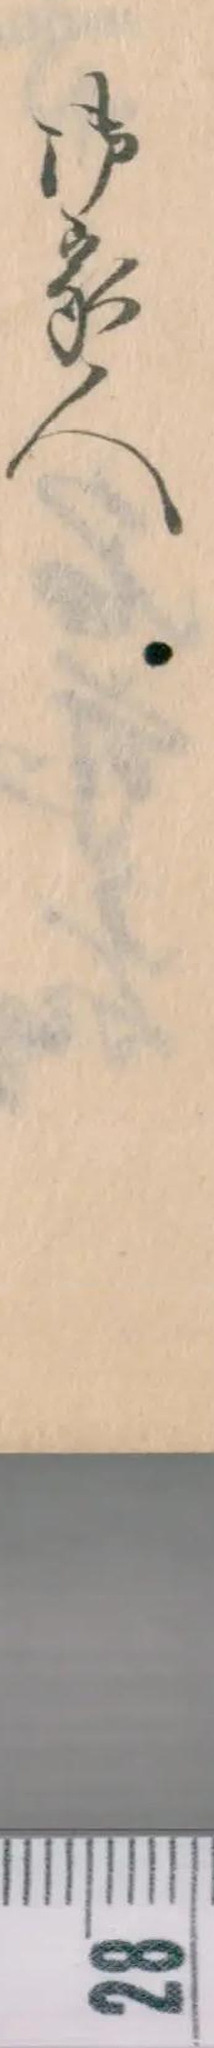御家人
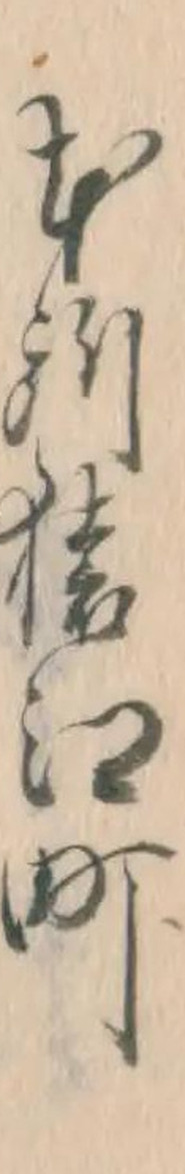本所猿江町
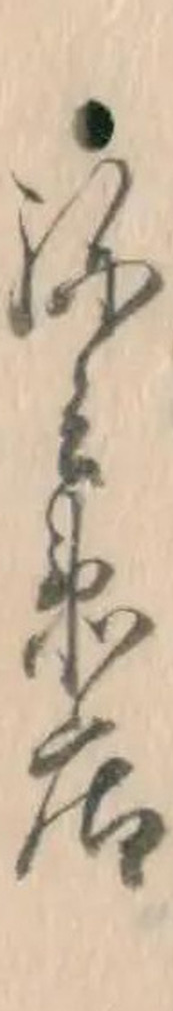弥兵衛店
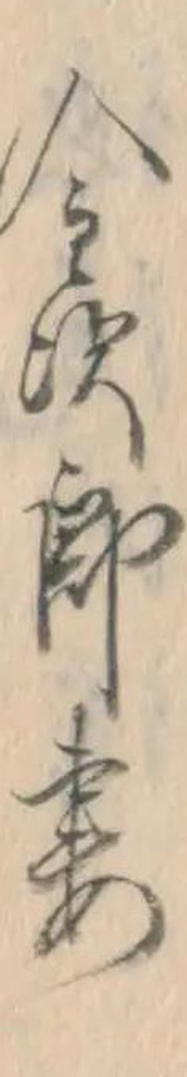金次郎妻

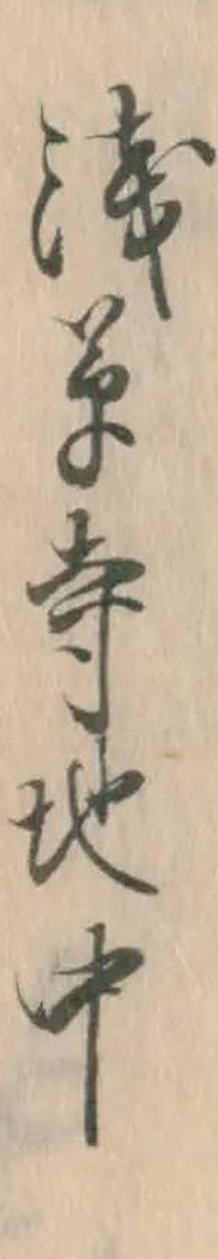浅草寺地中
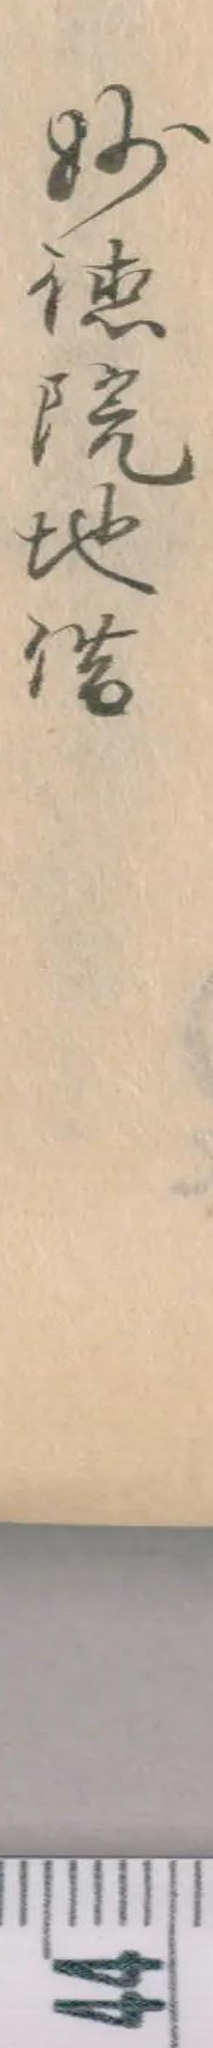妙徳院地借
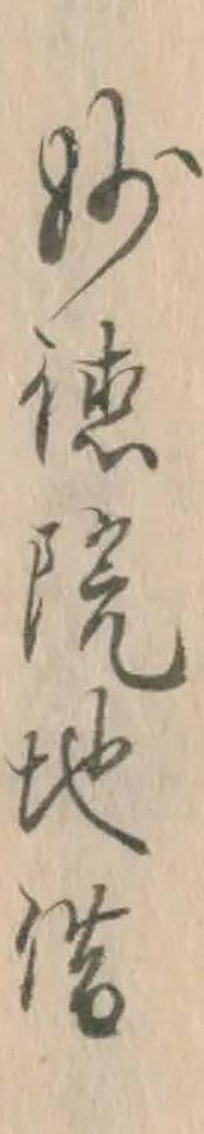妙徳院地借
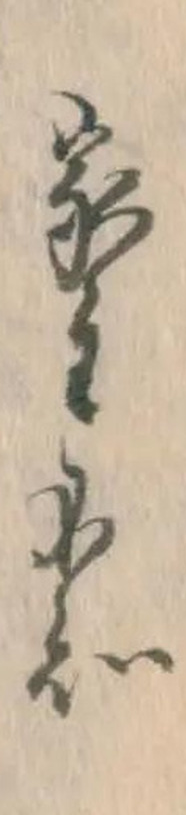家主不知
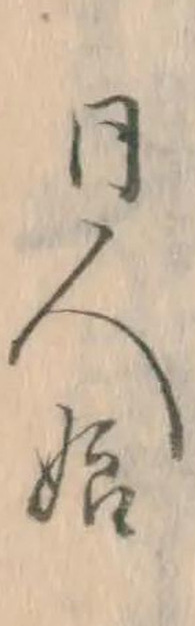同人娘
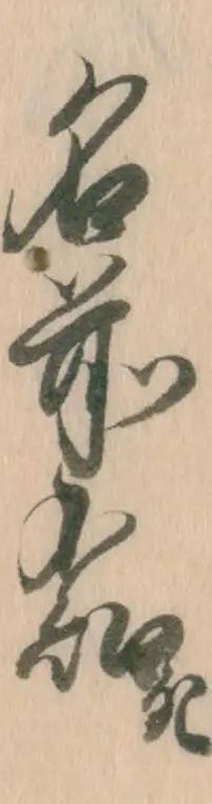名前不知死
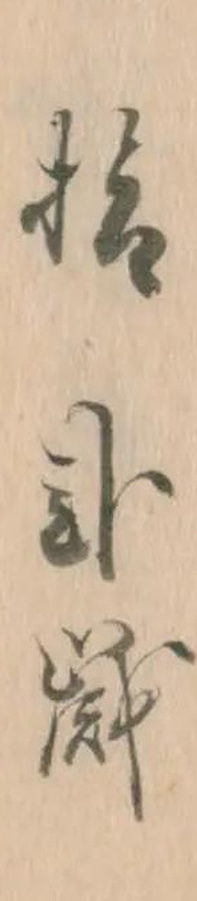拾弐歳
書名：武家方并寺院等ニテ施差出候一件
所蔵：国立国会図書館 National Diet Library, JAPAN
